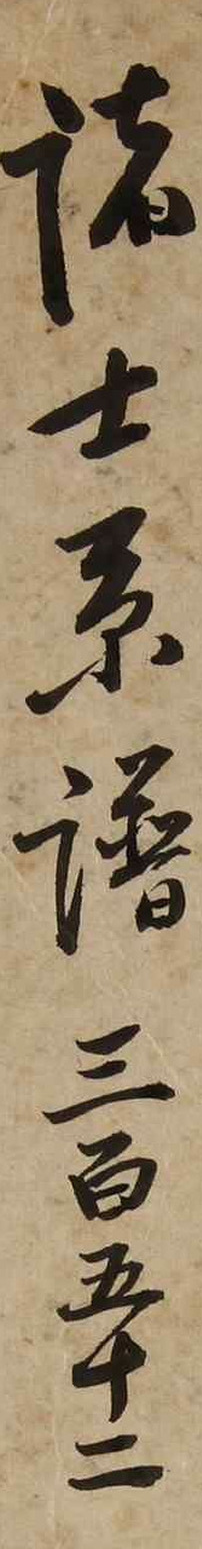諸士系譜三百五十二

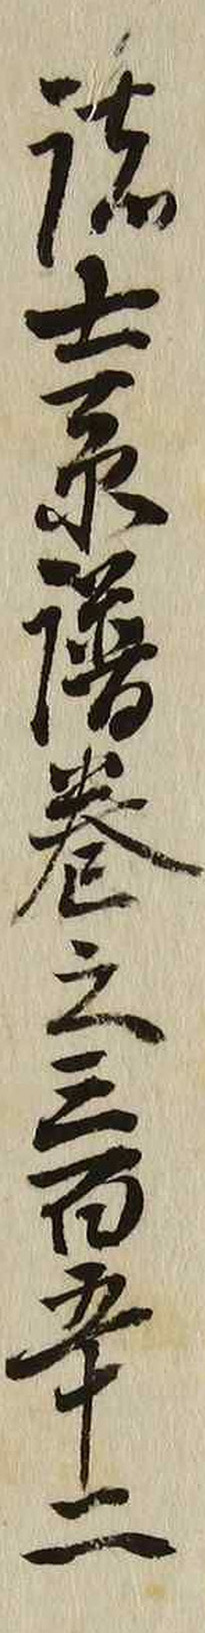諸士系譜巻之三百五十二
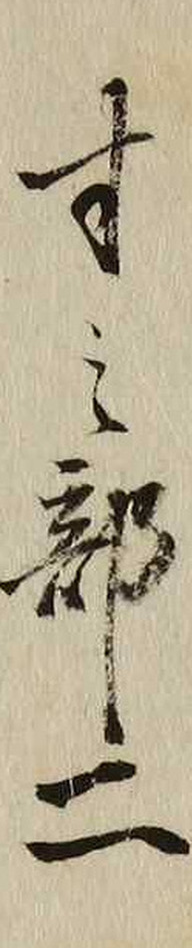す之部二
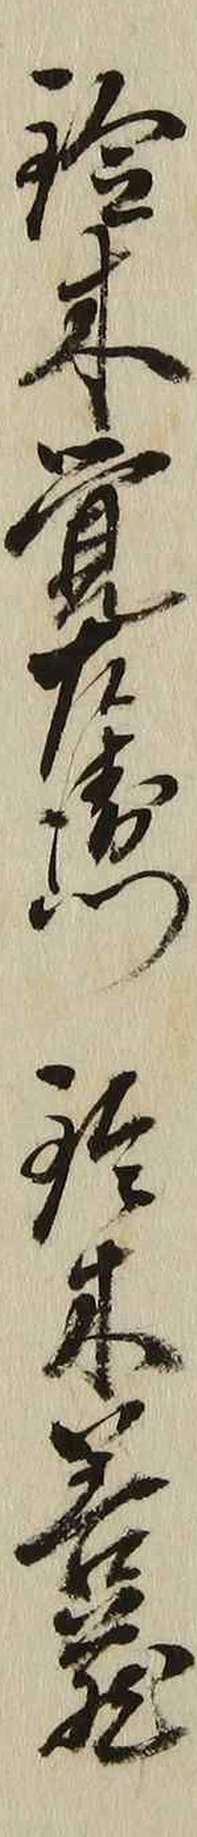鈴木覚左衛門鈴木善蔵
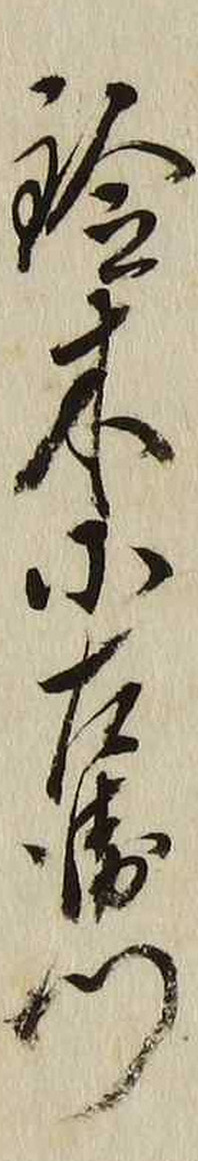鈴木小左衛門

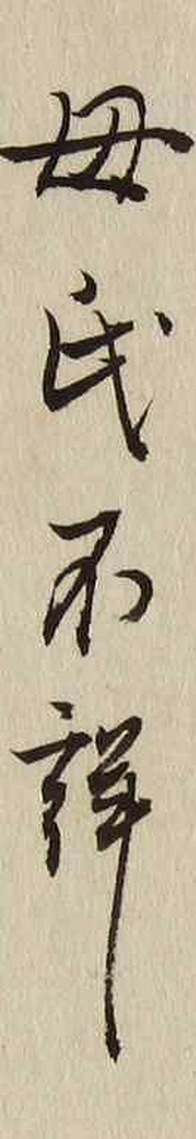母氏不詳
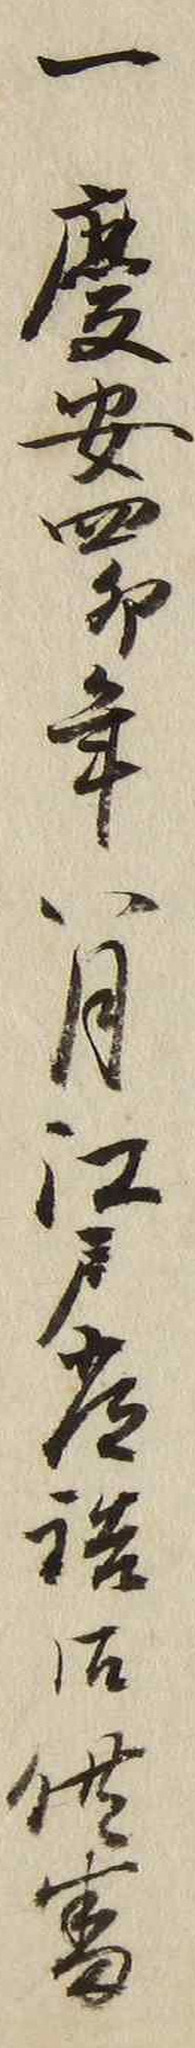一慶安四卯年八月江戸常詰御供番

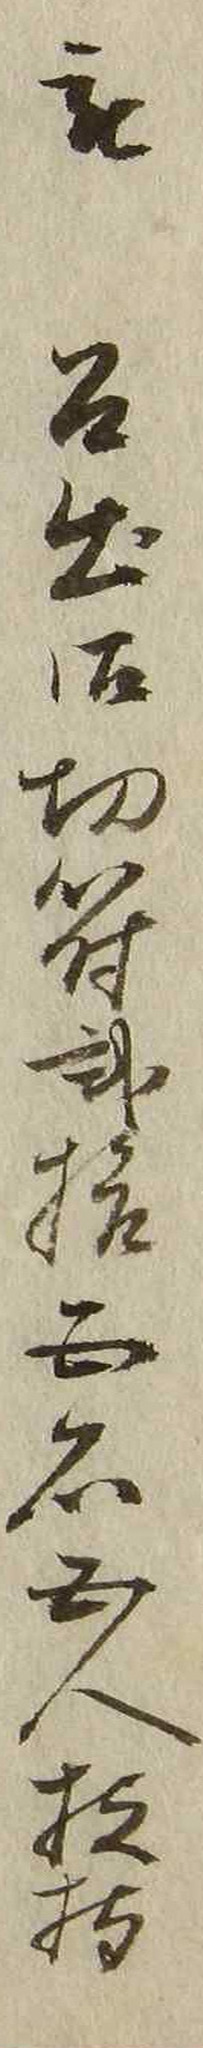被召出御切符弐拾五石五人扶持
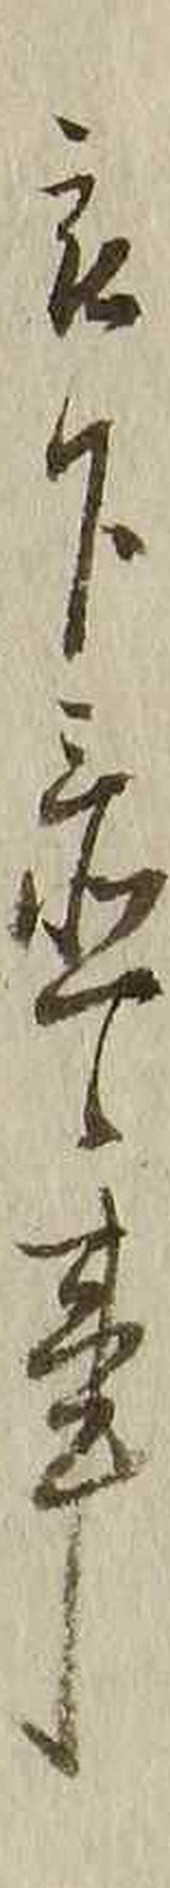被下置候事
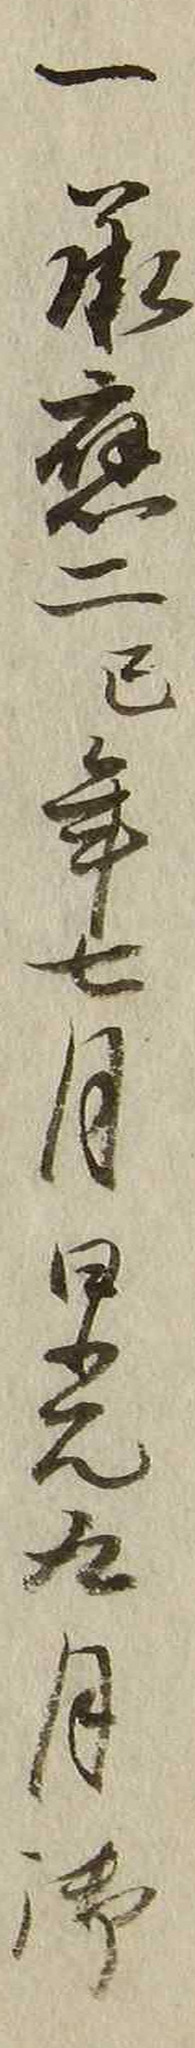一承応二巳年七月日光九月御
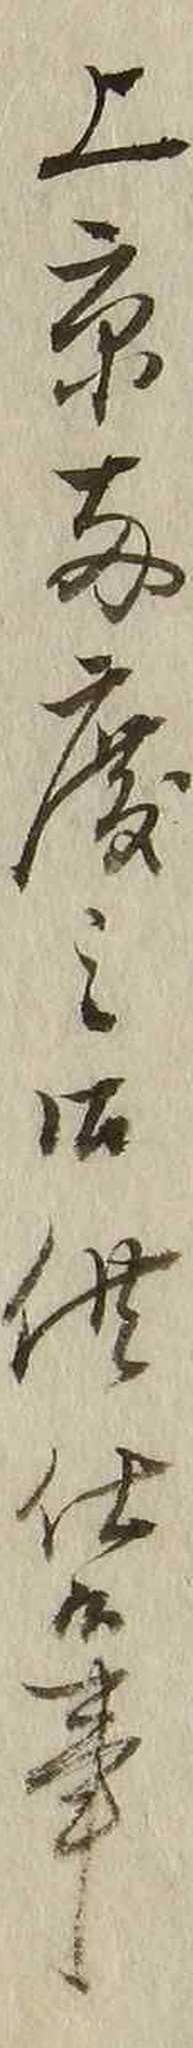上京両度之御供仕候事
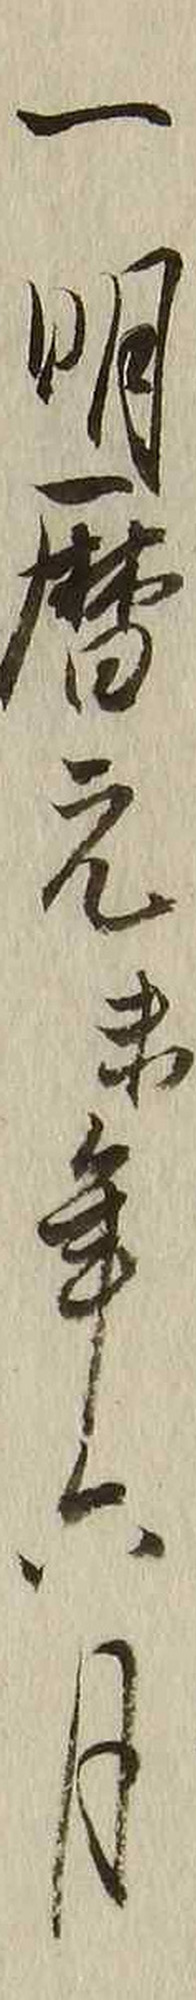一明暦元末年六月
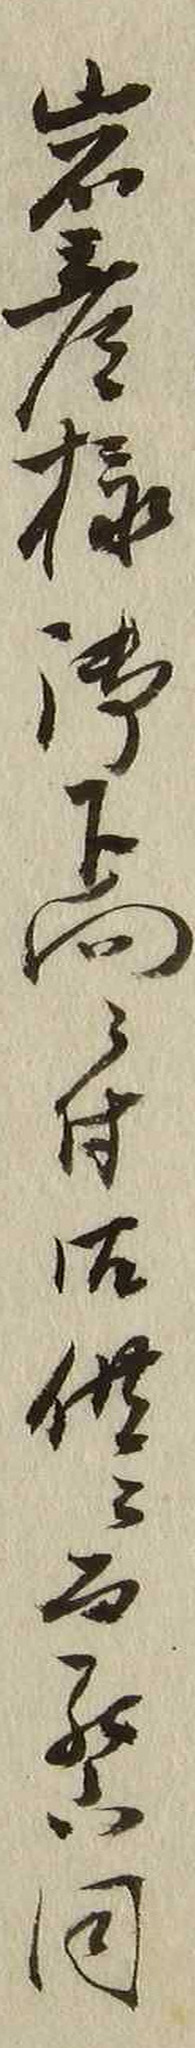岩彦様御下向ニ付御供ニ而罷下同
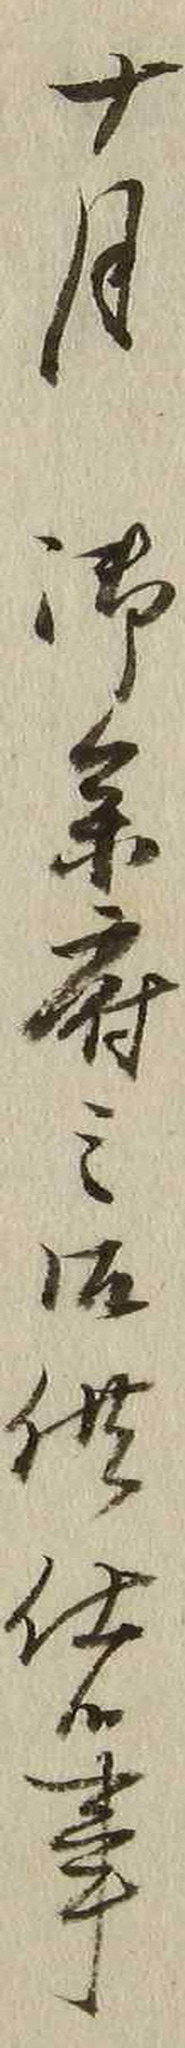十月御参府之御供仕候事
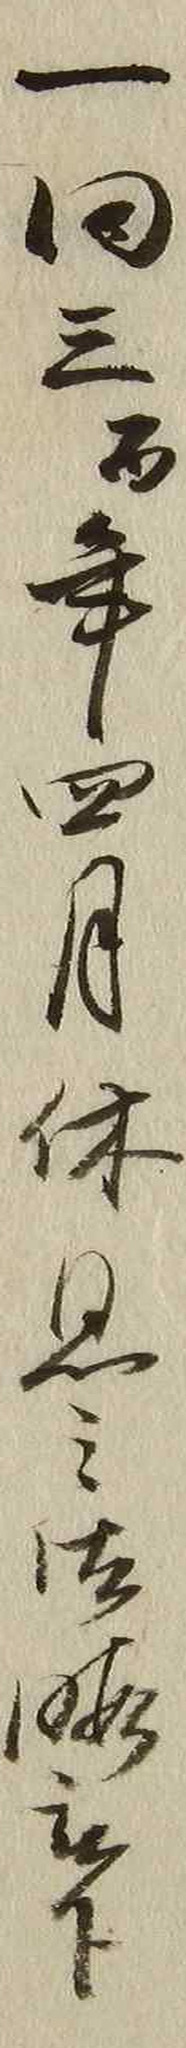一同三酉年四月休息之御暇被下
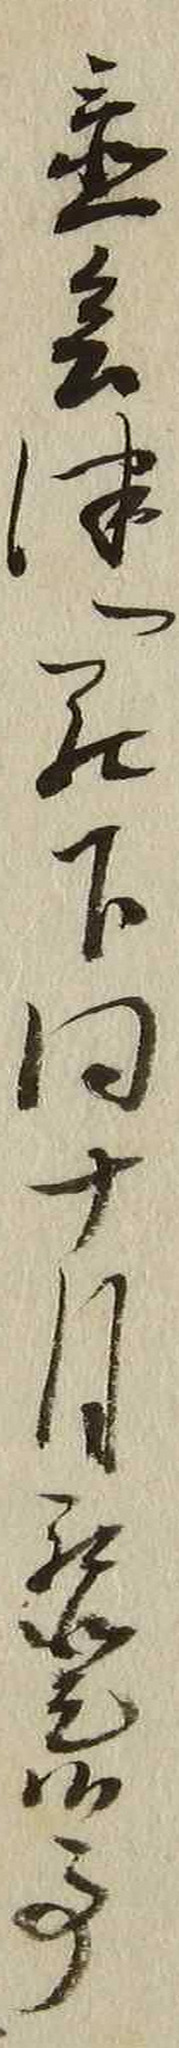置会津へ罷下同十月罷登候事
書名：諸士系譜　巻之352　す之部2
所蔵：会津若松市立会津図書館
